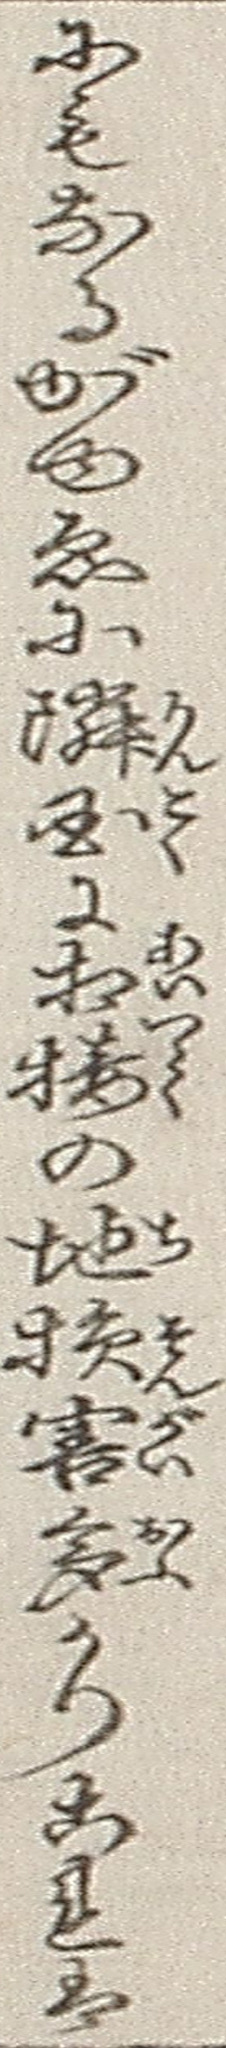にもなるがゆゑに隣国に相接の地損害多かりこれは
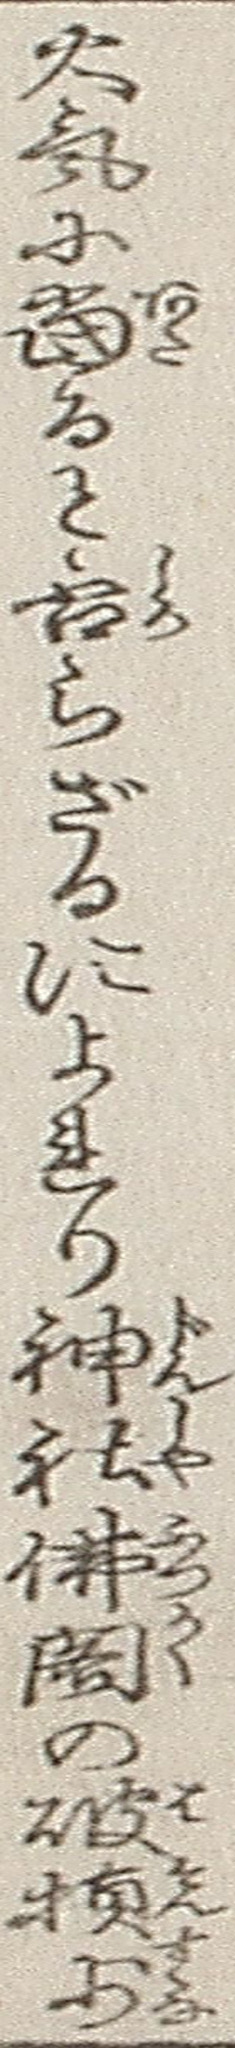火気に当ると否らざるによれり神社仏閣の破損少
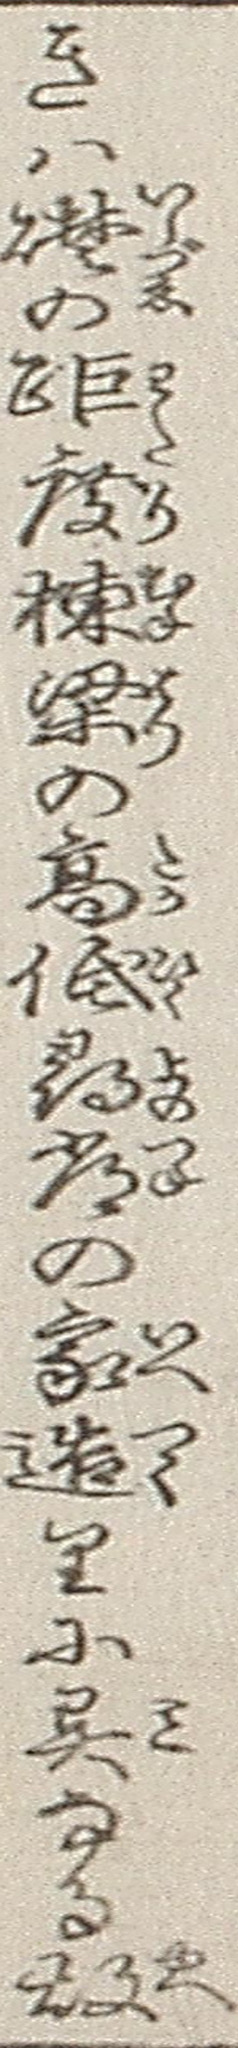きハ礎の距度棟梁の高低尋常の家造りに異なる故
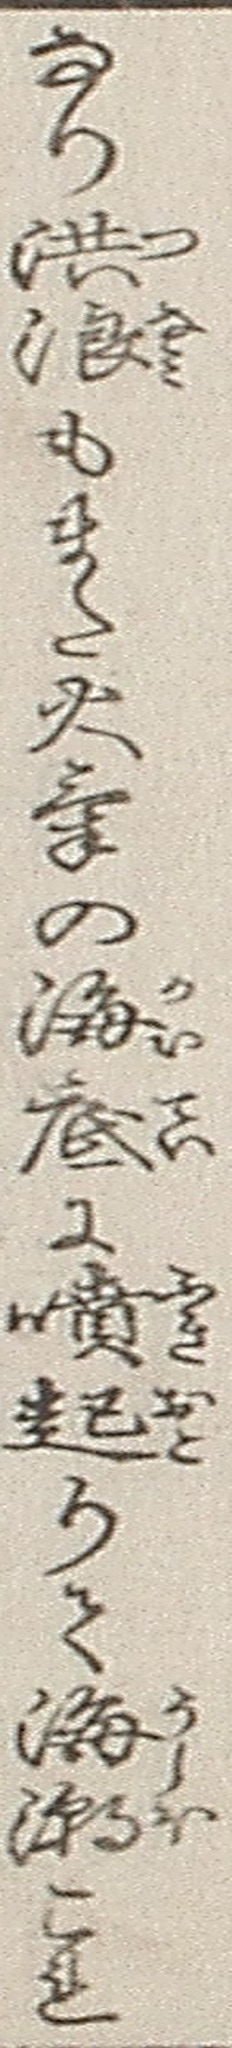なり洪浪もまた火気の海底に噴起りて海潮これ

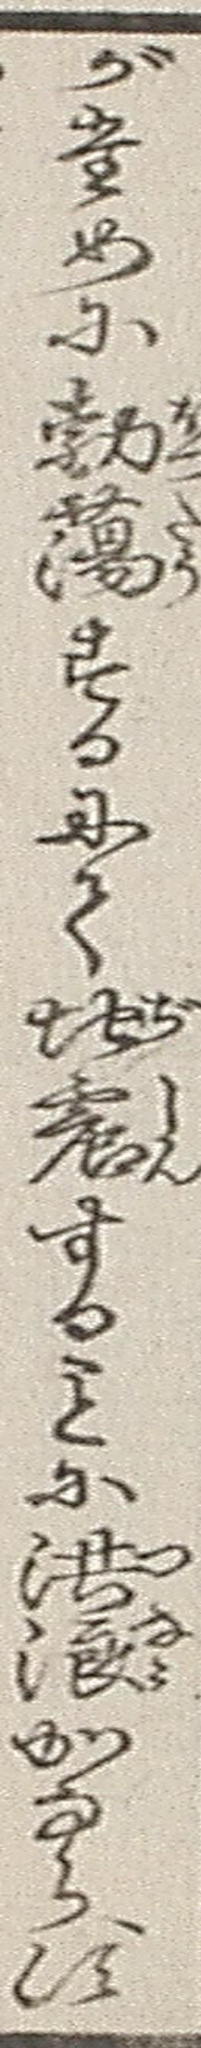がために勃蕩するにて地震することに洪浪かならす
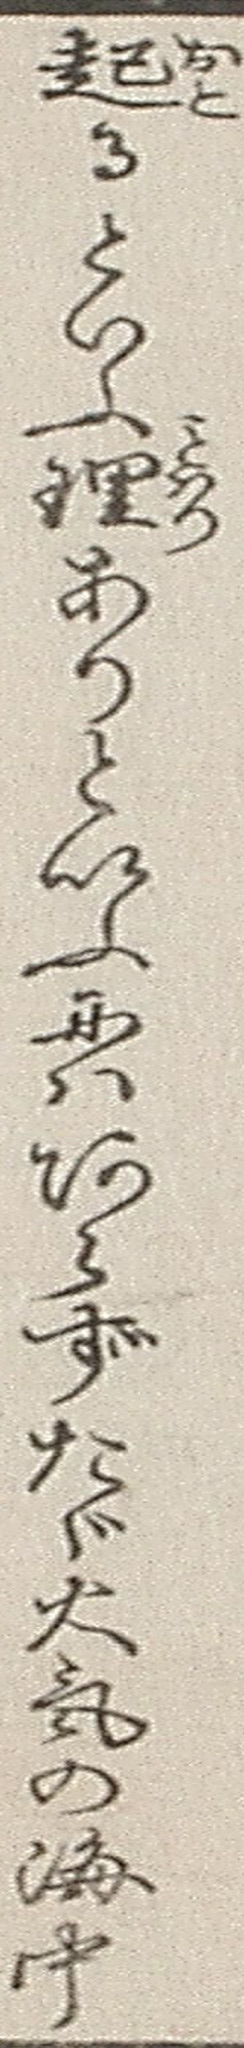起るといふ理ありといふにはあらずたゞ火気の海中
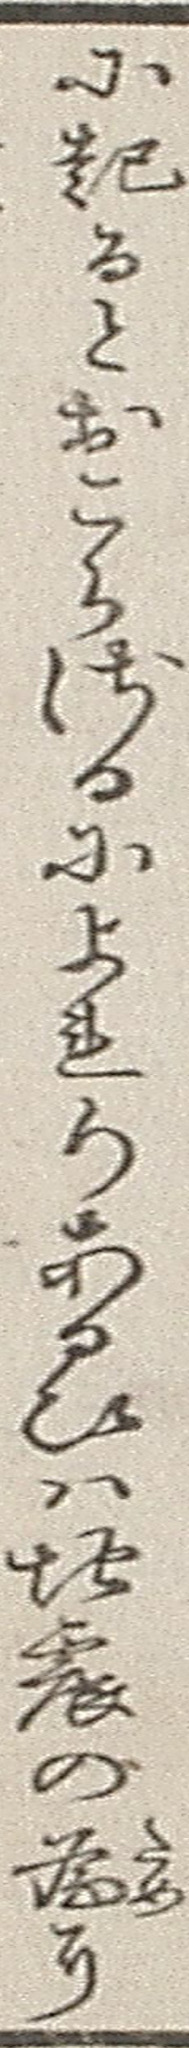に起るとおこらさるによれりあるひは地震の為に
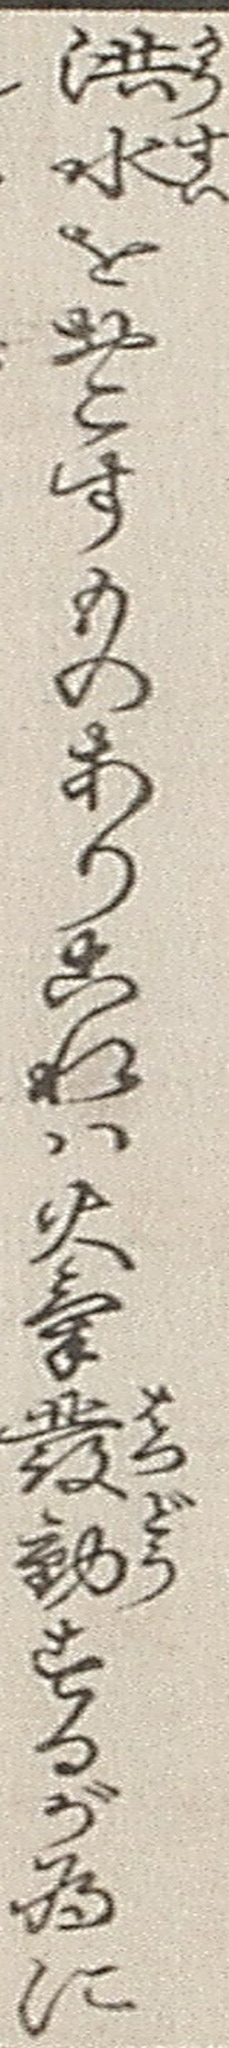洪水をおこすものありこれは火気発動するが為に
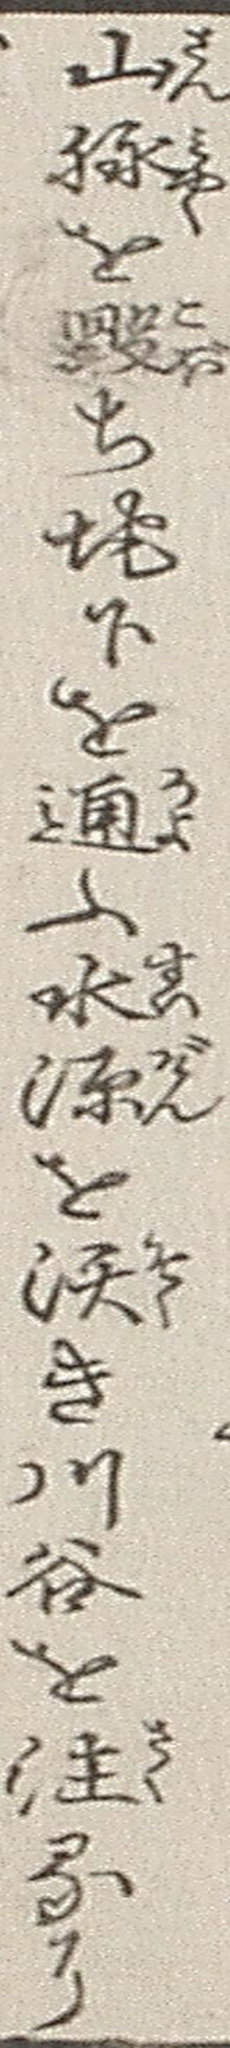山脈を毀ち地下を通ふ水源を沃き川谷を注るに
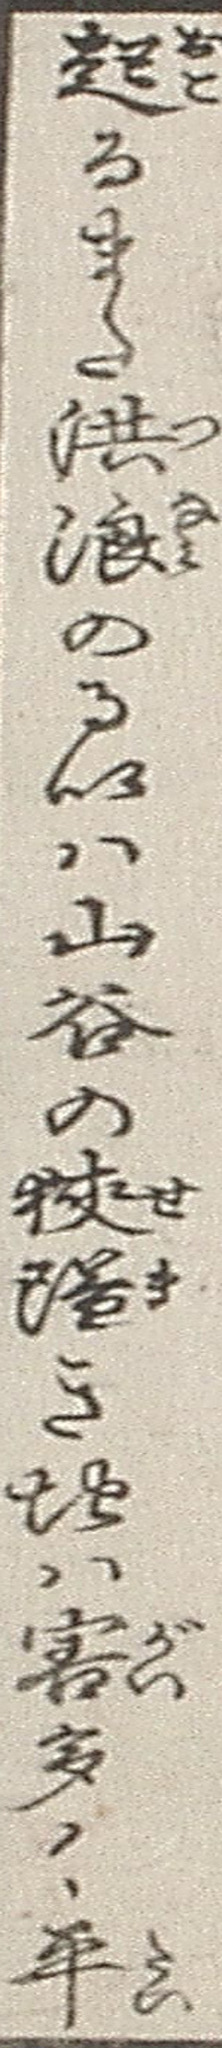起るまた洪浪のるいは山谷の狭隘き地は害多く平
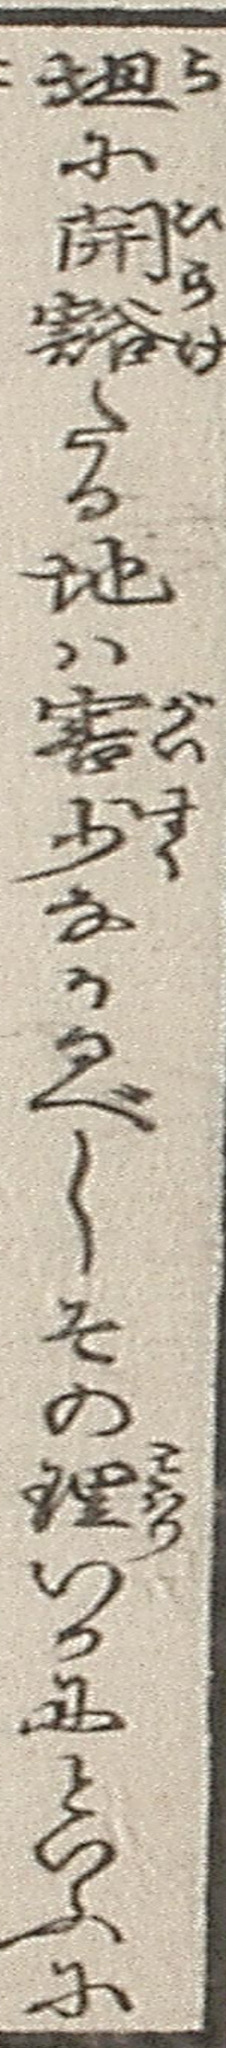坦に開豁たる地は害少なかるべしその理いかにといふに
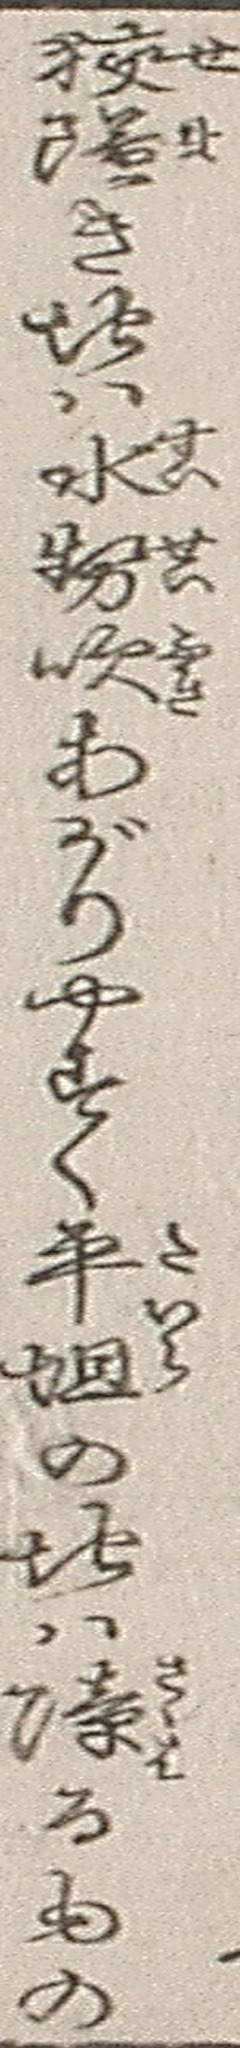狭隘き地は水勢吹あがりやすく平坦の地は障るもの
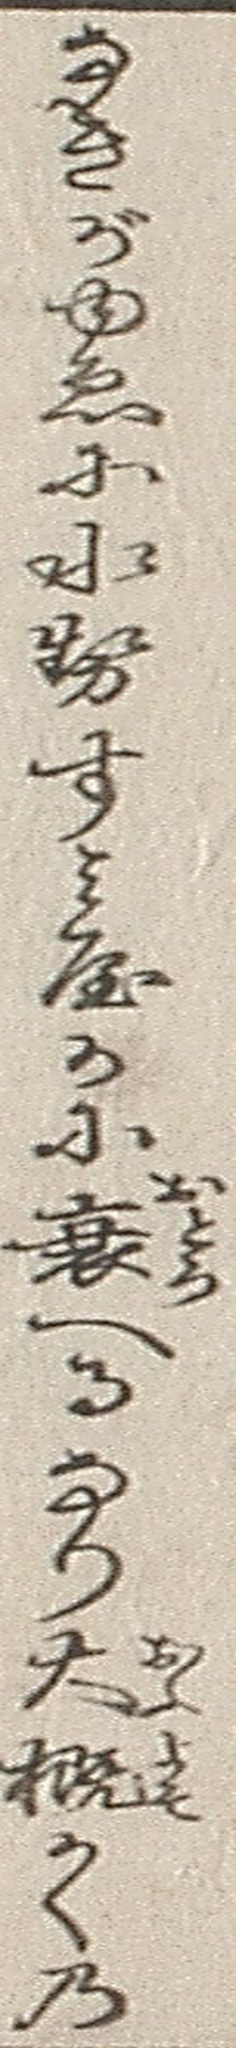なきがゆゑに水勢すみやかに衰へるなり大概かくの
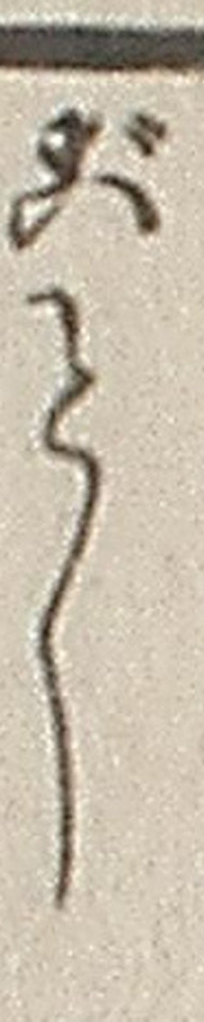ごとし
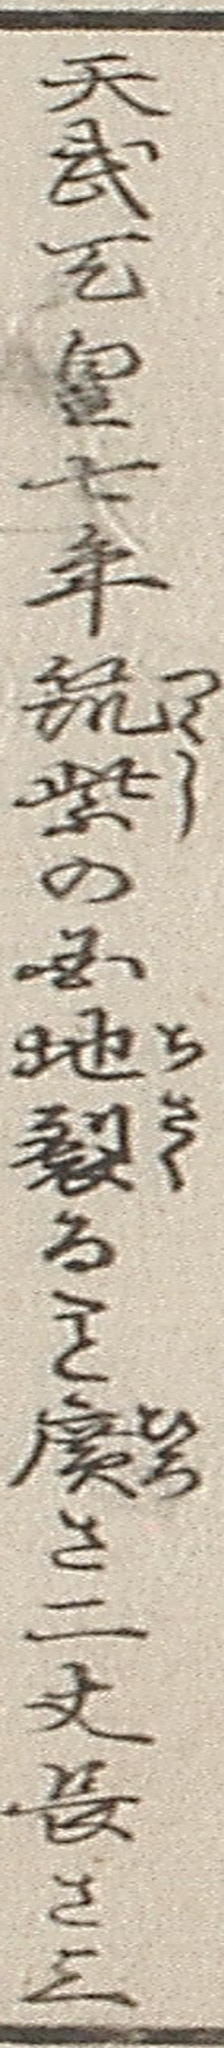天武天皇七年筑紫の国地裂ること広さ二丈長さ三
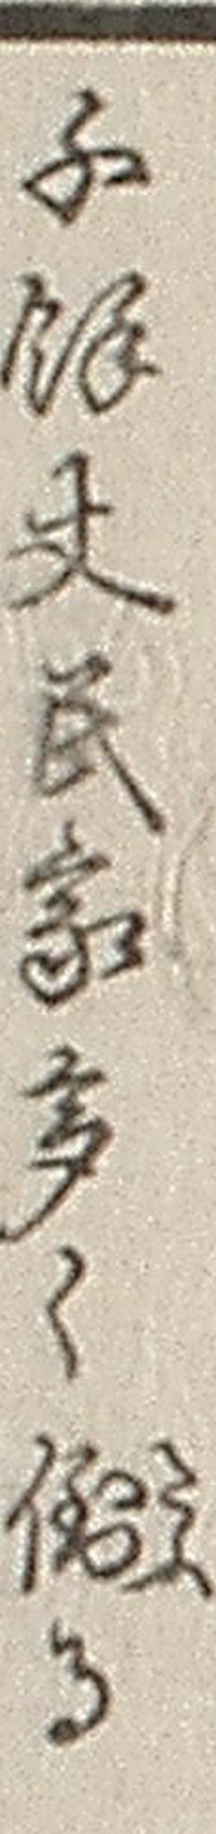千余丈民家多く倒る
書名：大地震暦年考　全
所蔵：東京大学地震研究所図書室 Earthquake Research Institute Library, The University of Tokyo, JAPAN
